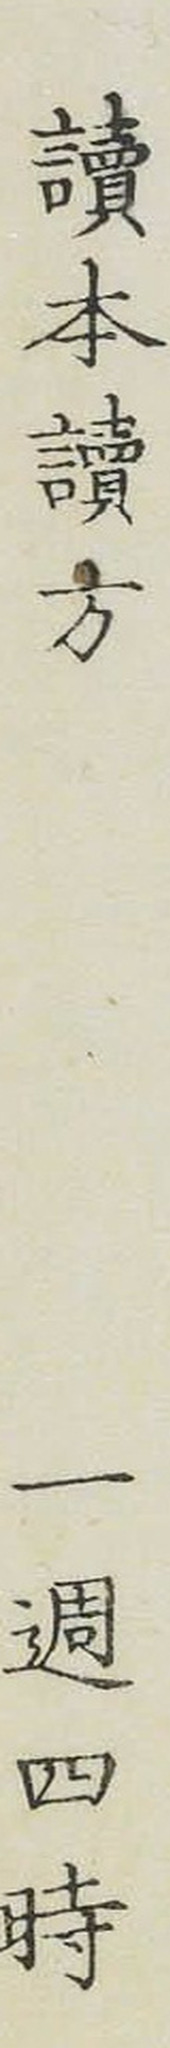読本読方一週四時
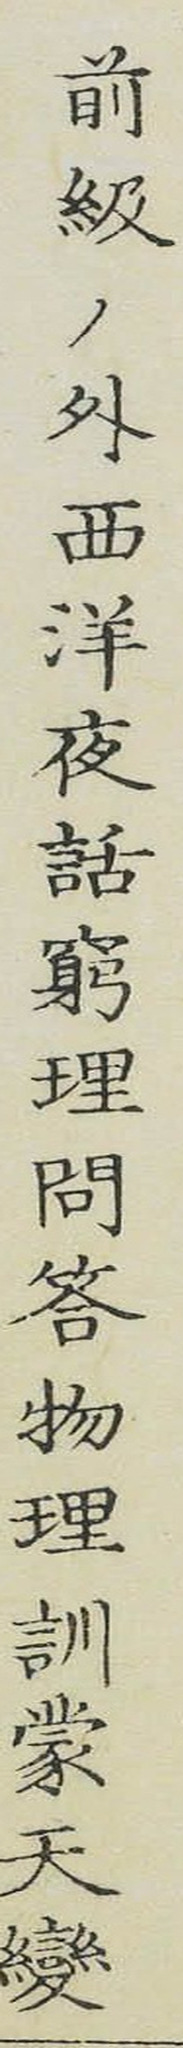前級ノ外西洋夜話窮理問答物理訓蒙転変

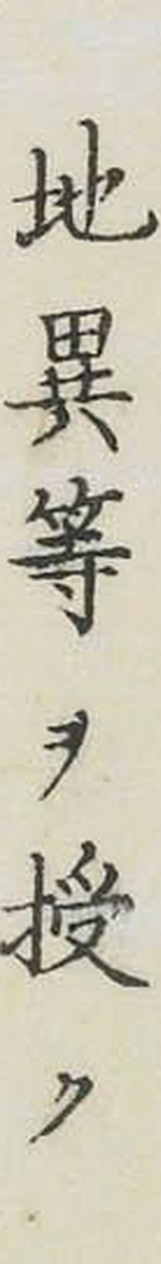地異等ヲ授ク
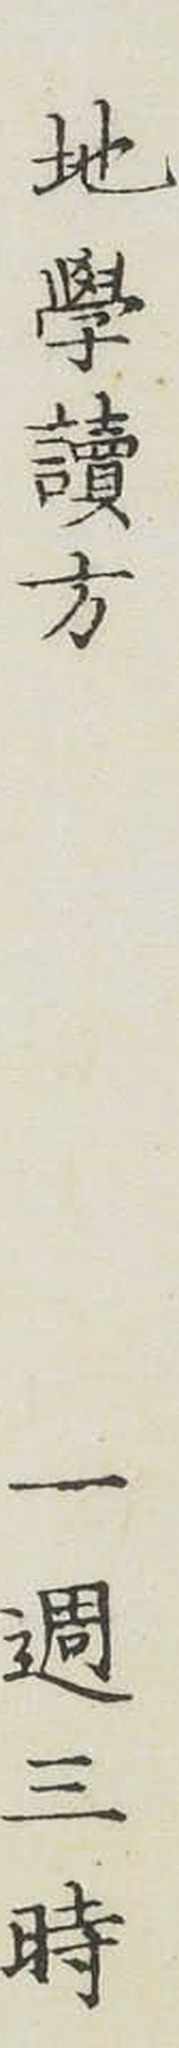地学読方一週三時
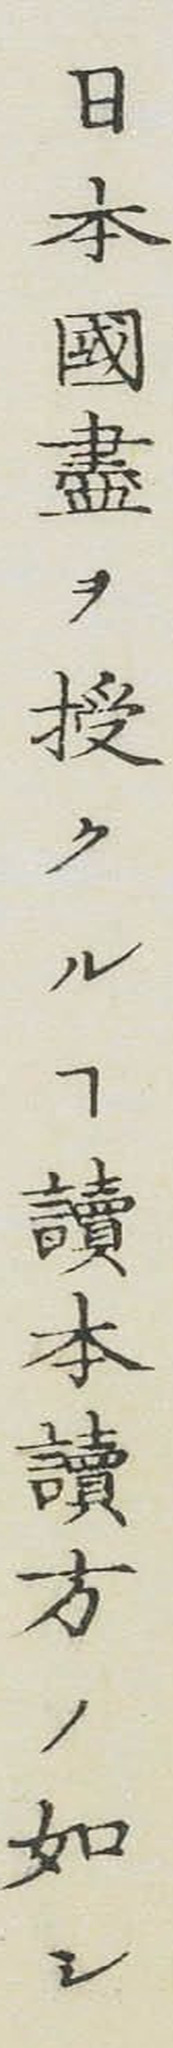日本国盡ヲ授クル事読本読方ノ如シ
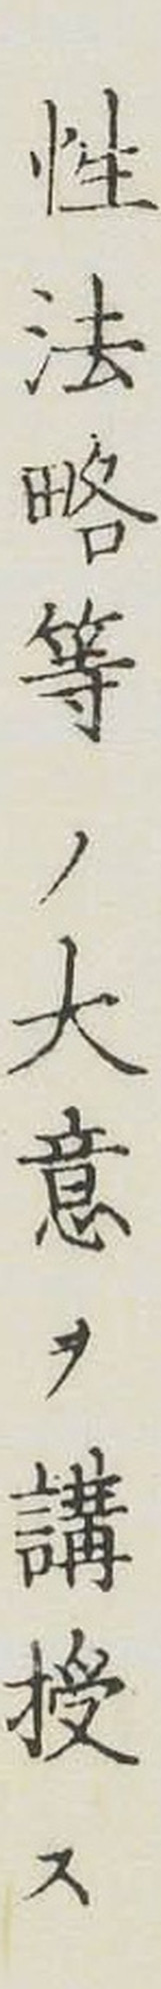性法略等ノ大意ヲ講授ス
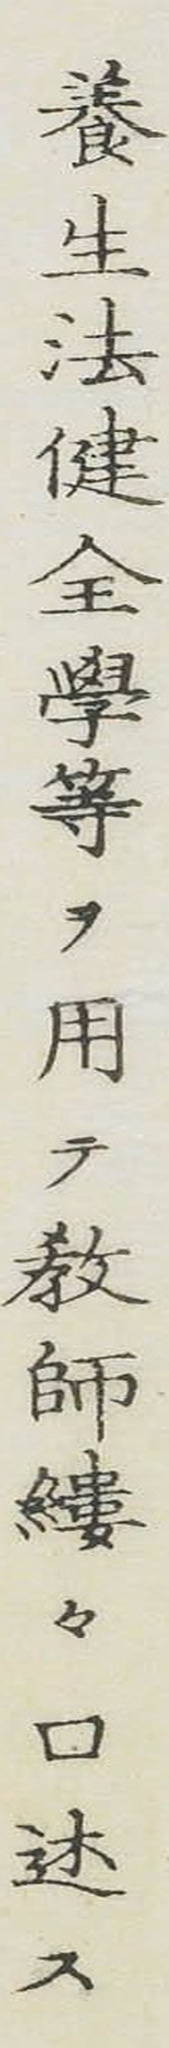養生法健全学等ヲ用テ教師縷々口述ス
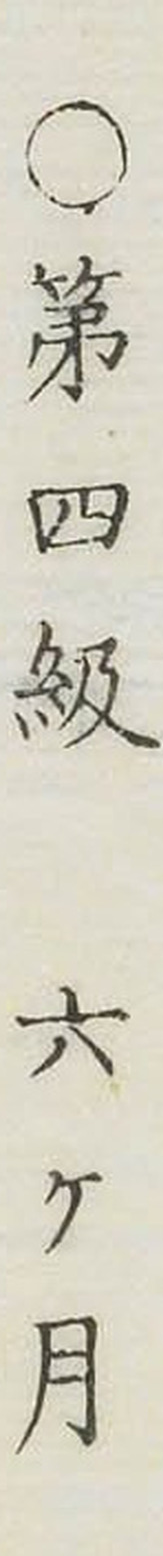○第四級六ケ月
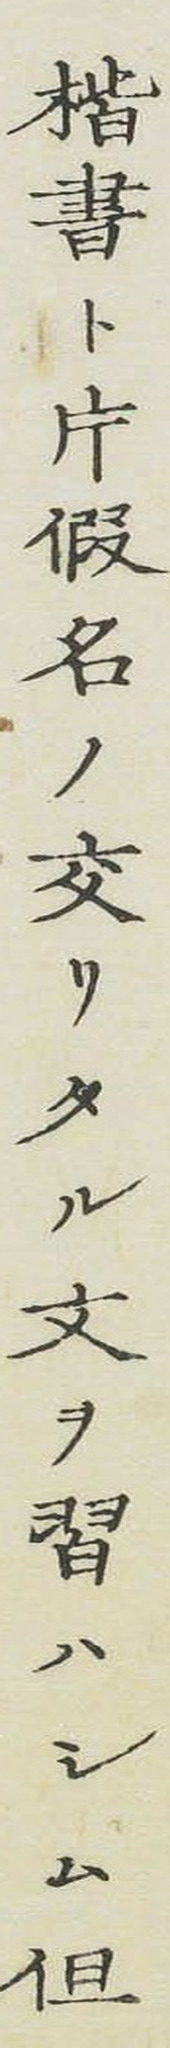楷書ト片仮名ノ交リタル文ヲ習ハシム但
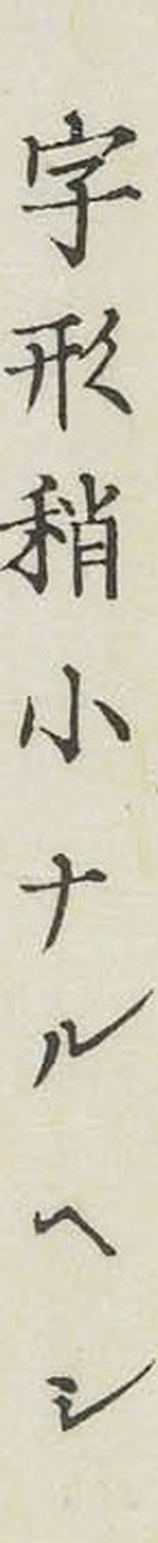字形稍小ナルヘシ
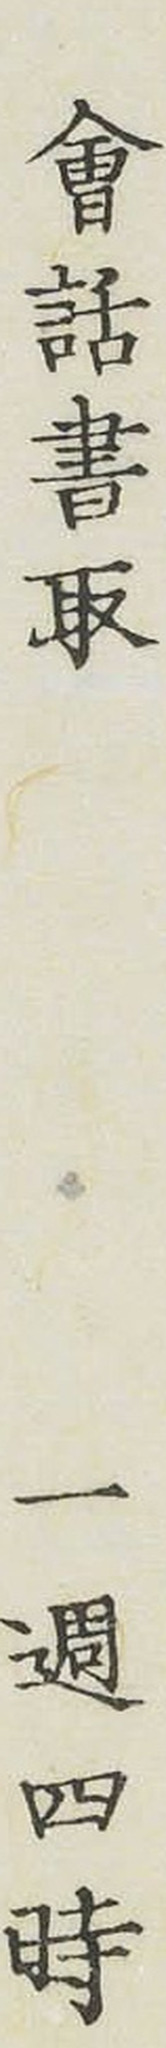会話書取一週四時
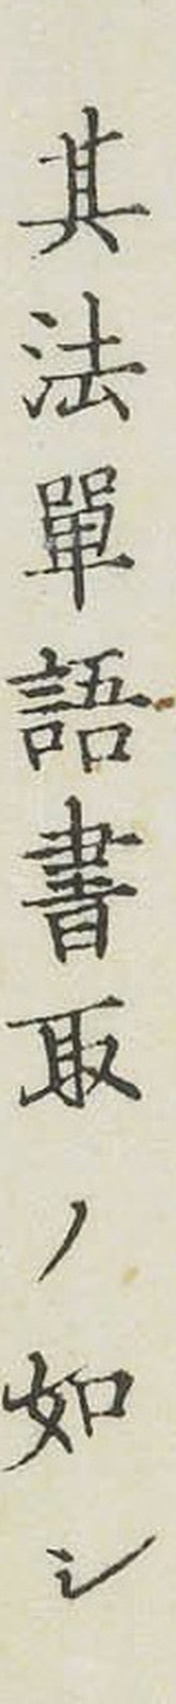其法単語書取ノ如シ
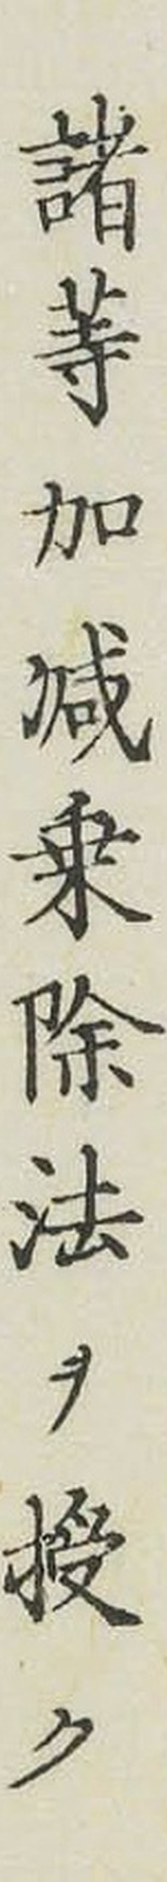諸等加減乗除法ヲ授ク
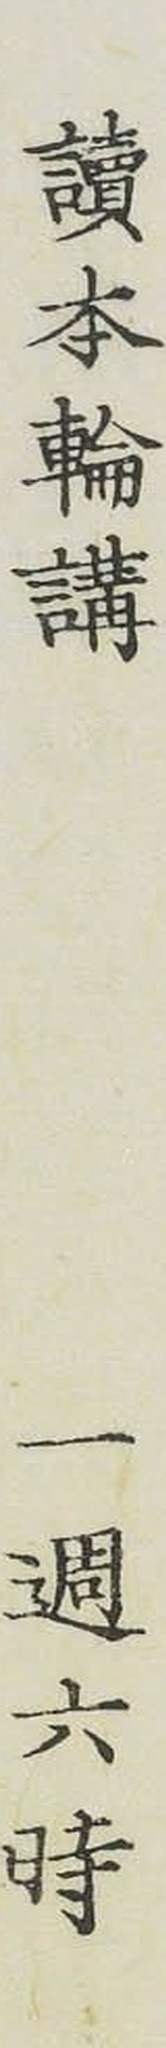読本輪講一週六時
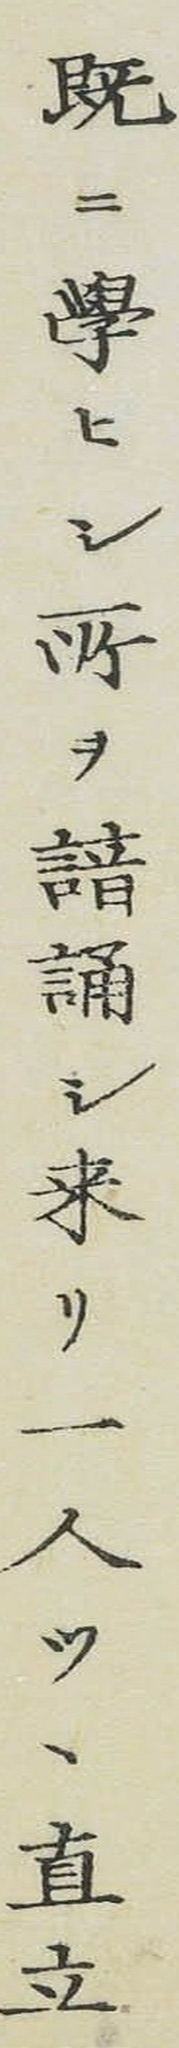既ニ学ヒシ所ヲ諳誦シ来リ一人ツヽ直立
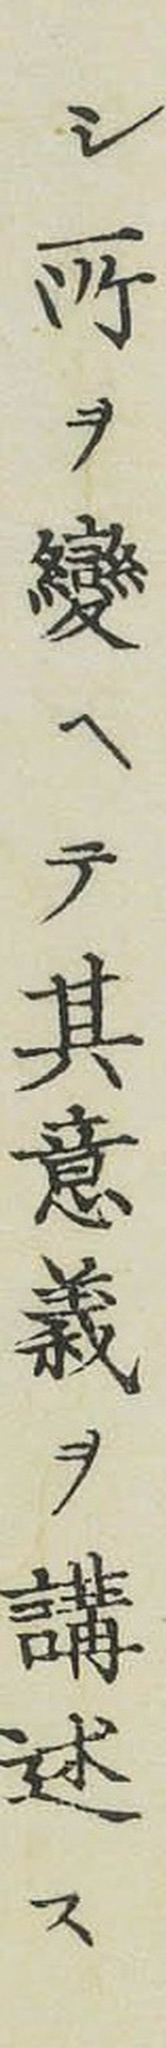シ所ヲ変ヘテ其意義ヲ講述ス
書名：小学教則
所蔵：東京学芸大学教育コンテンツアーカイブ
